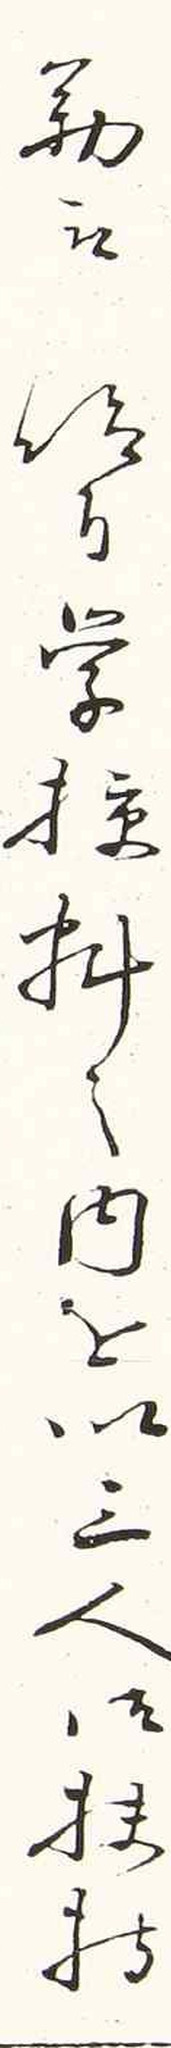勤被仰付学校料之内を以三人御扶持
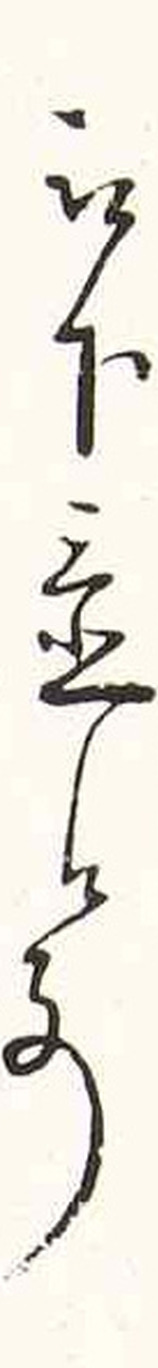被下置候事
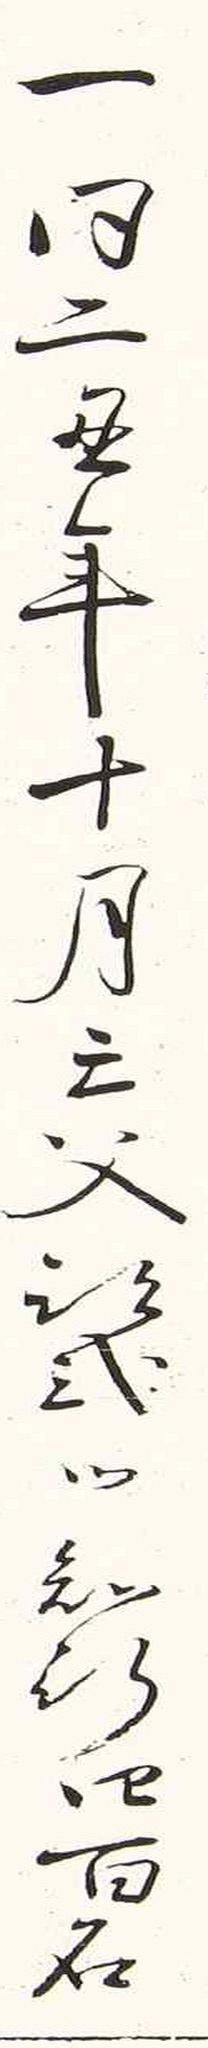一同二丑年十月亡父跡式御知行四百石
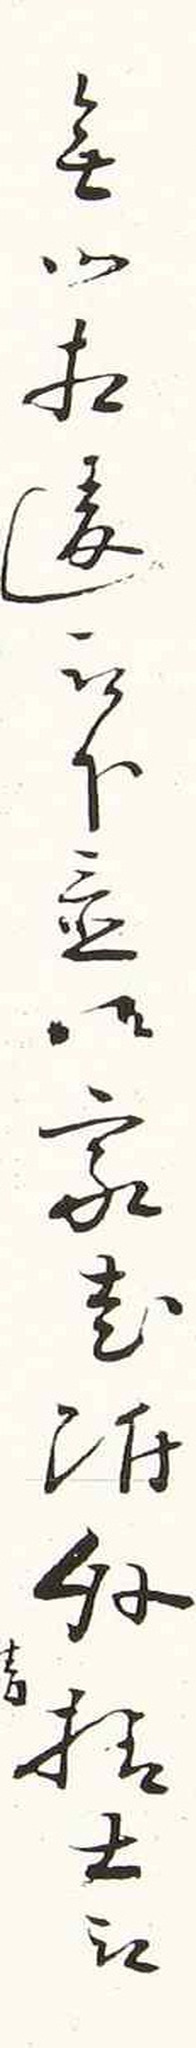無御相違被下置御家老附外様士被
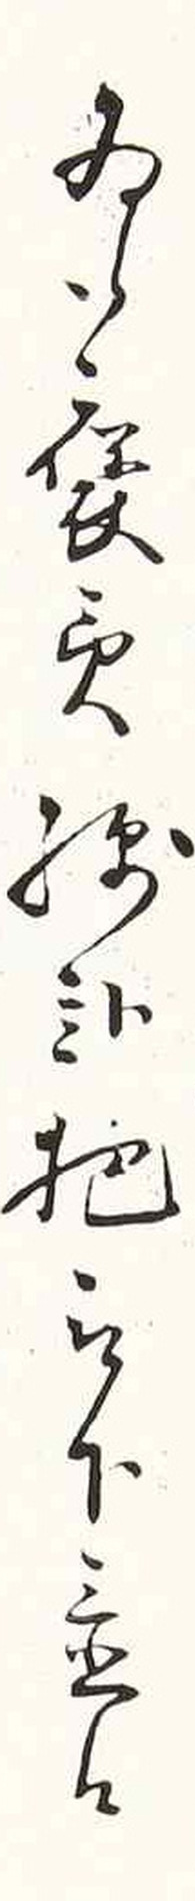為御褒美綿弐把被下置候
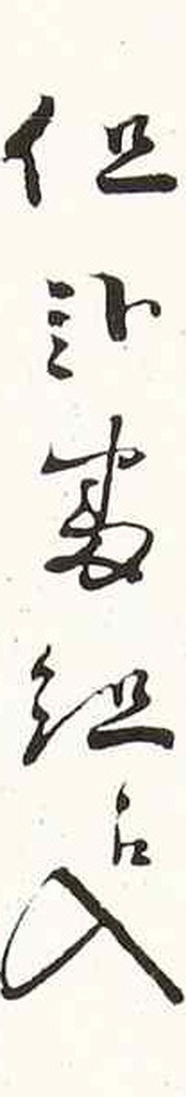但弐番組江入
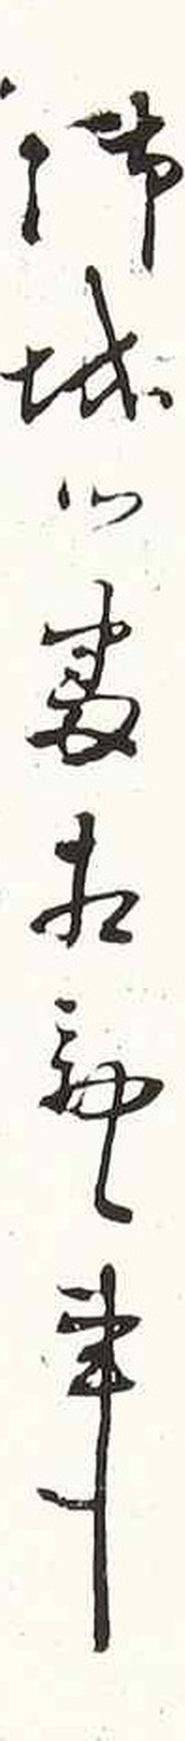御城御番相勤候事
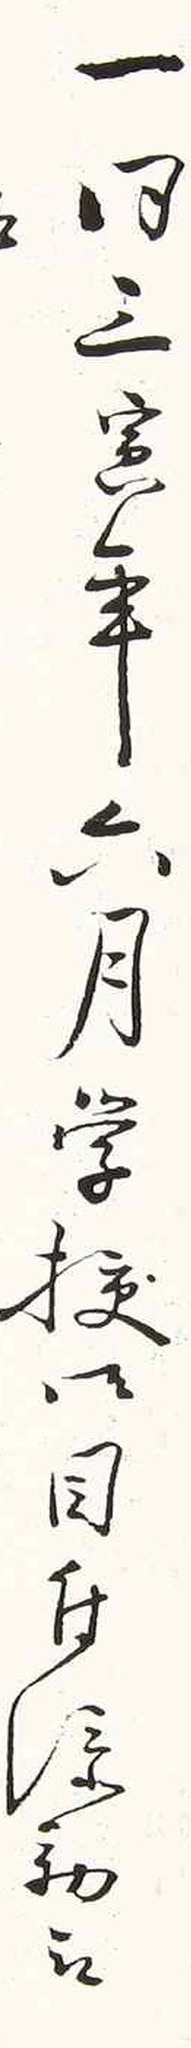一同三寅年六月学校御目付添勤被
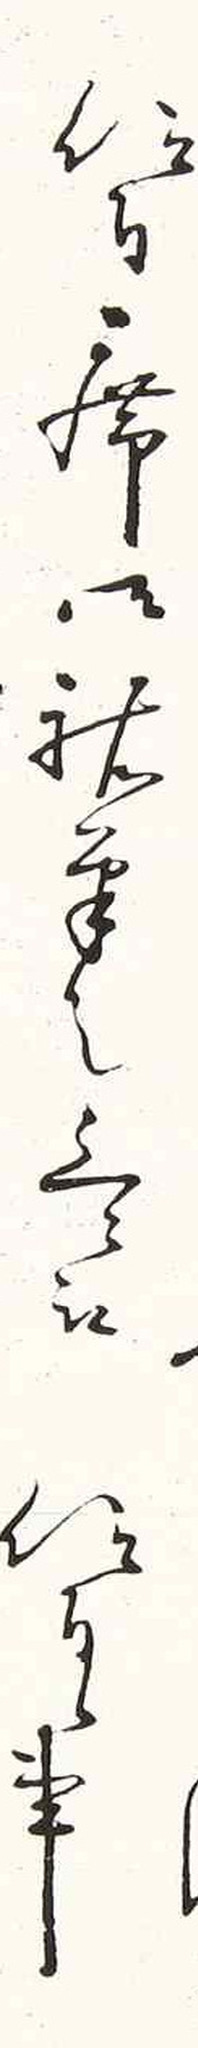仰付席御祐筆之上ニ被仰付候事
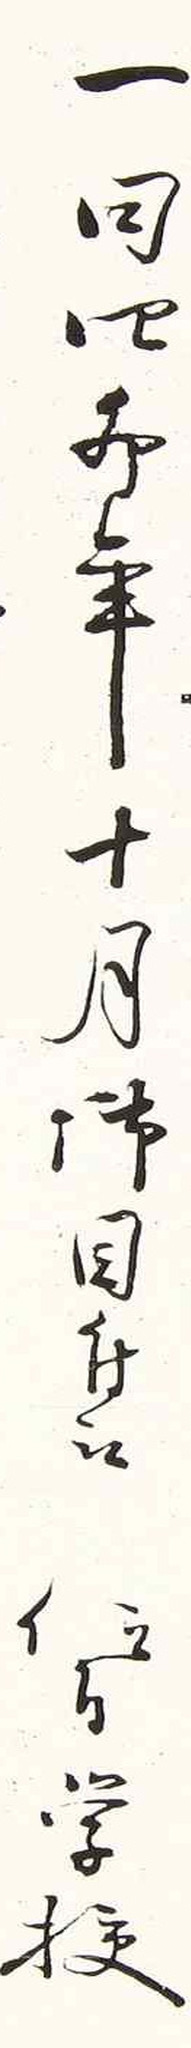一同四卯年十月御目付被仰付学校
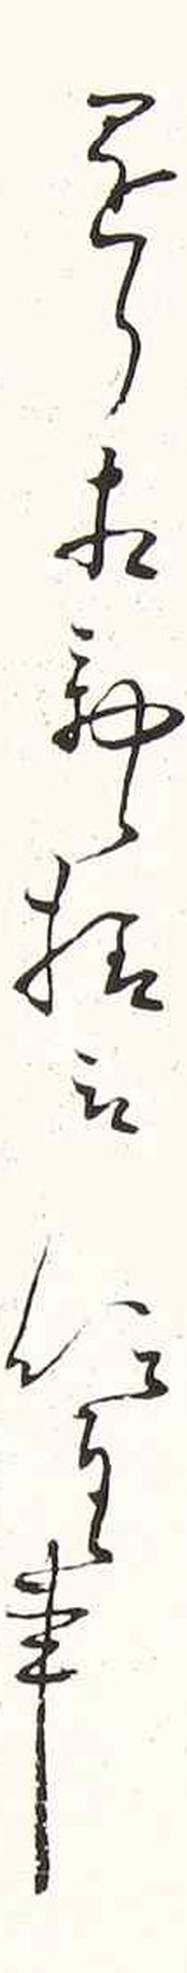懸り相勤候様被仰付候事
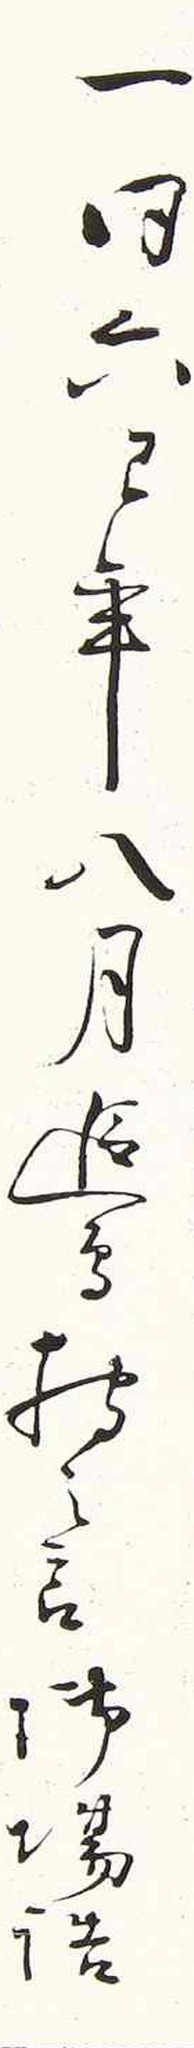一同六巳年八月追鳥狩之節御場詰
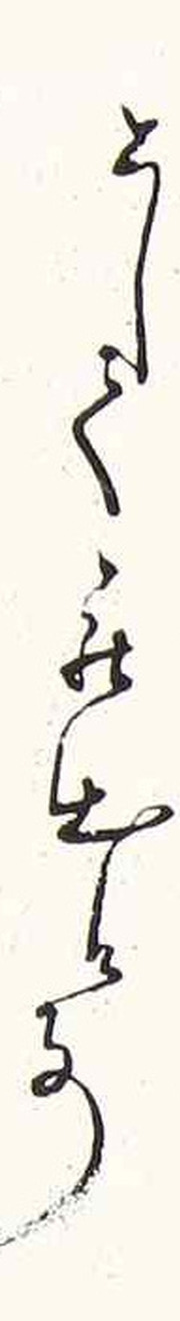として罷出候事
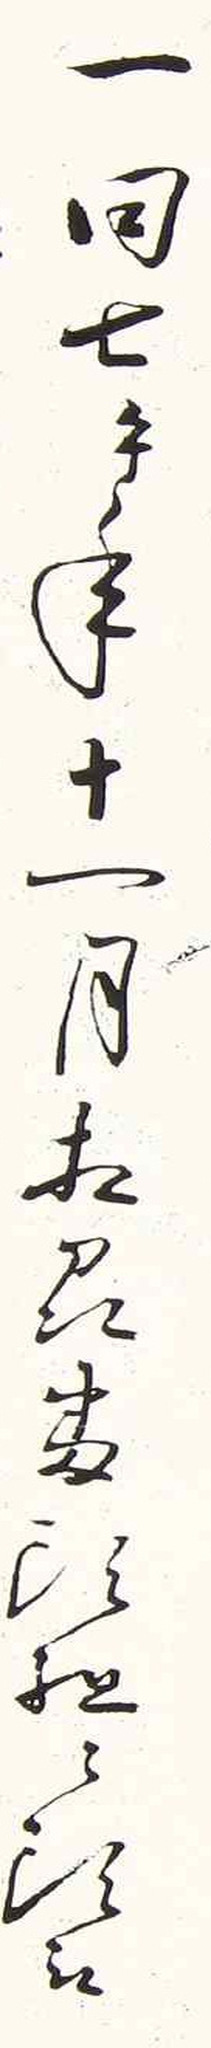一同七午年十一月相州番頭組ニ頭被
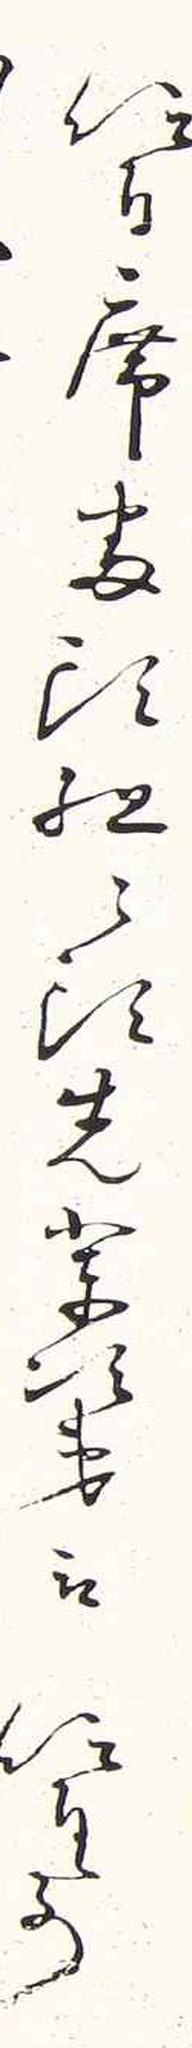仰付席番頭組ニ頭先輩次第被仰付候事
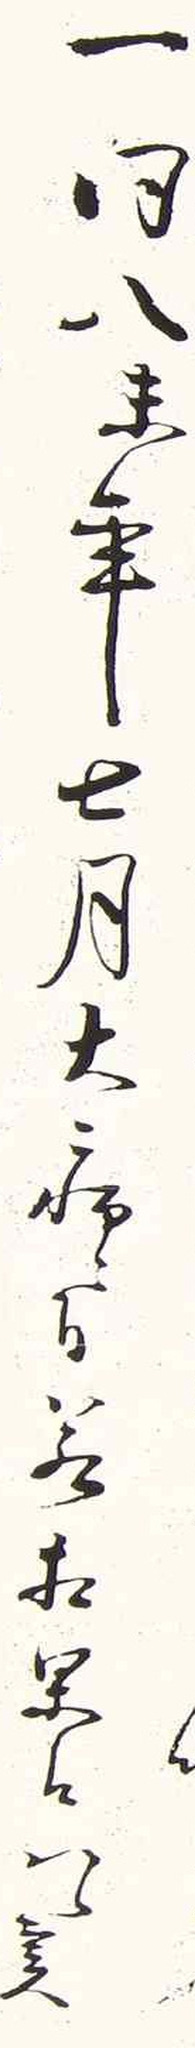一同八未年七月大病ニ付若相果候はゝ実
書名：諸士系譜　巻之357　す之部7
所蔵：会津若松市立会津図書館
